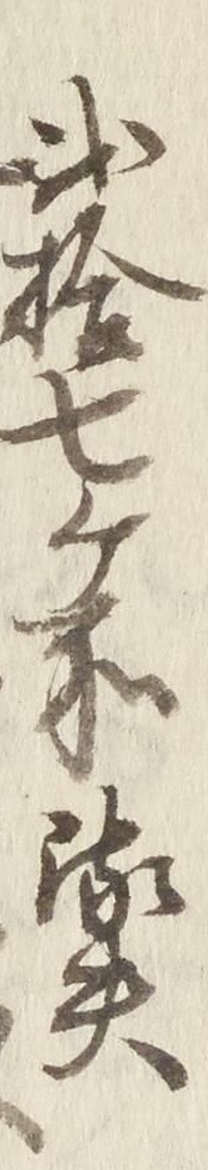内弐拾七ヶ所流失
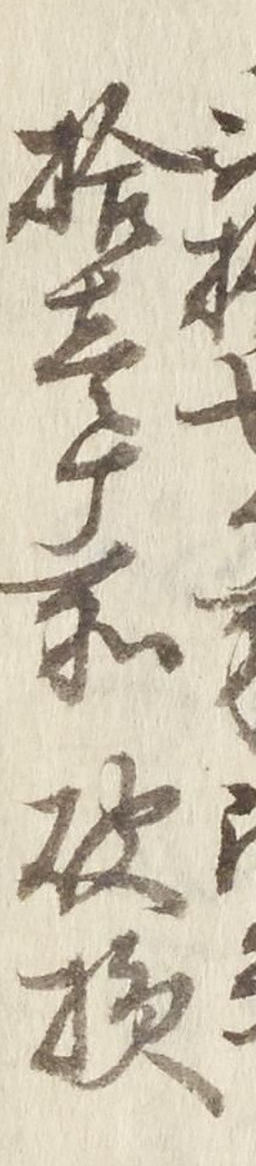拾壱ヶ所破損
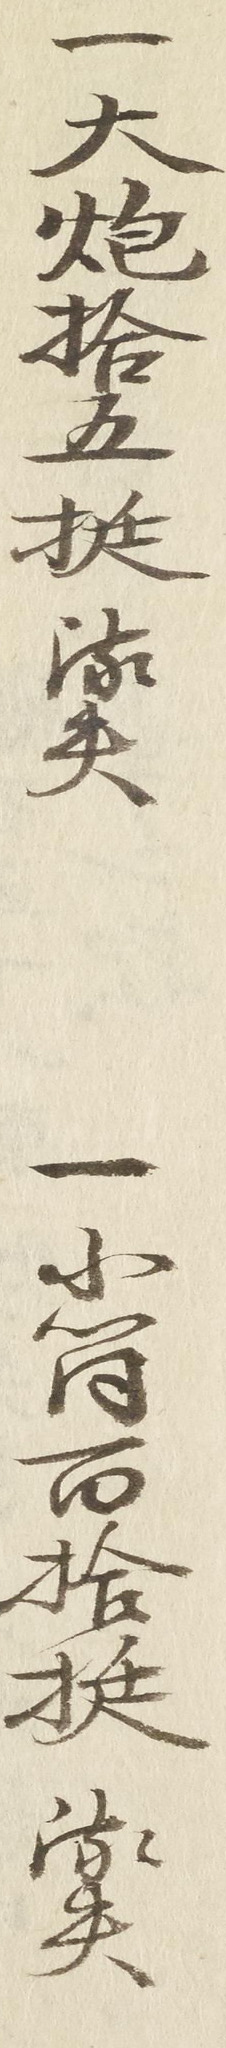一大砲拾五挺流失一小筒百拾挺流失
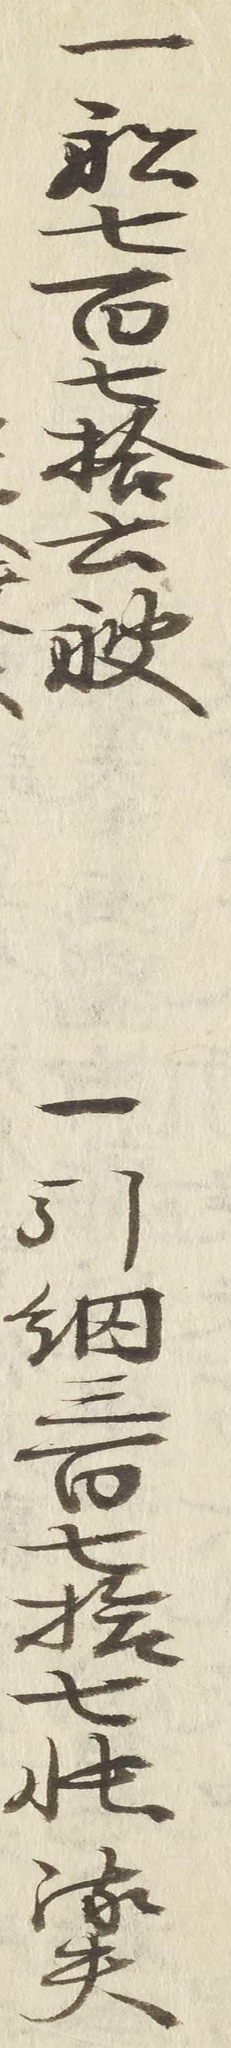一船七百七拾六艘一引綱三百七拾七帳流失
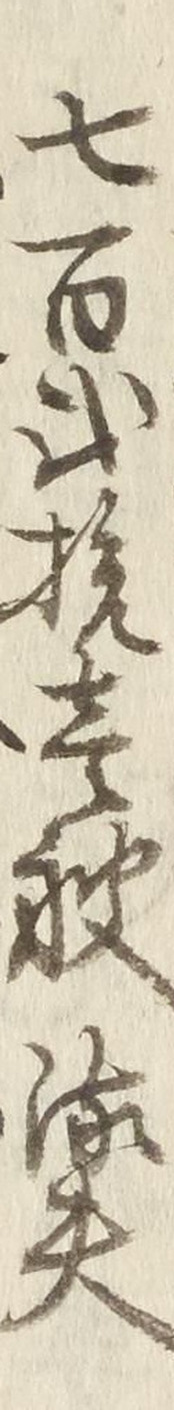内七百弐拾壱艘流失
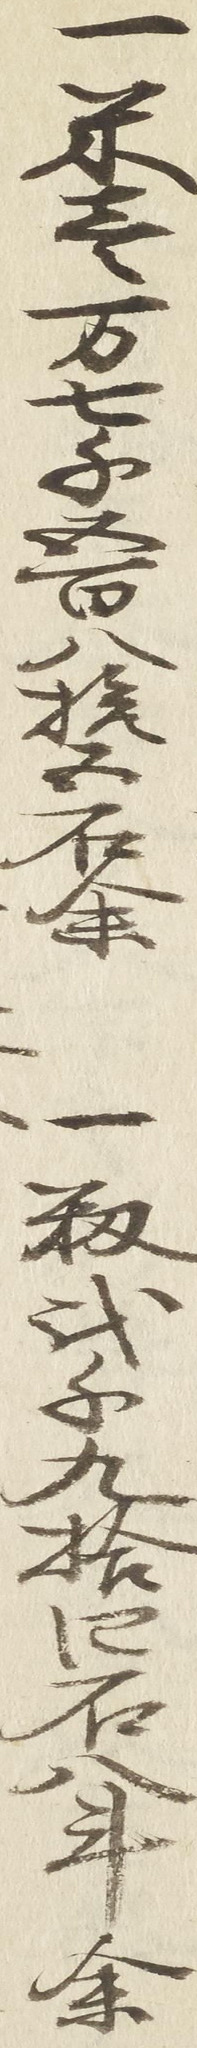一米壱万七千五百八拾五石余一籾弐千九拾四石八斗余
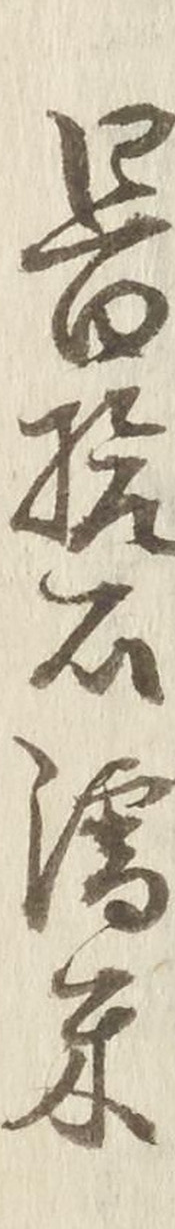八百拾石濡米
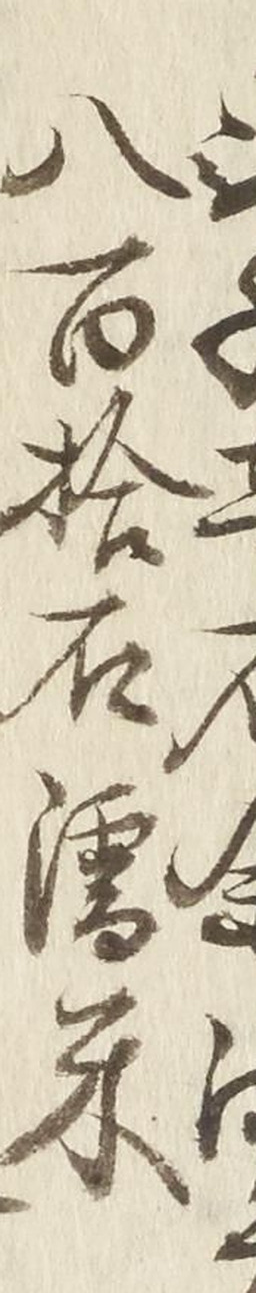八百拾石濡米
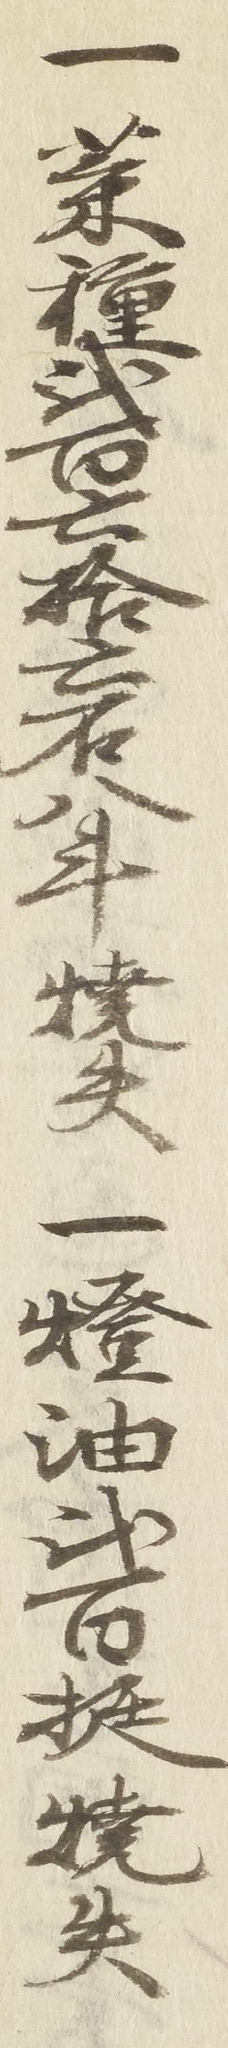一菜種弐百六拾六石八斗焼失一燈油弐百挺焼失
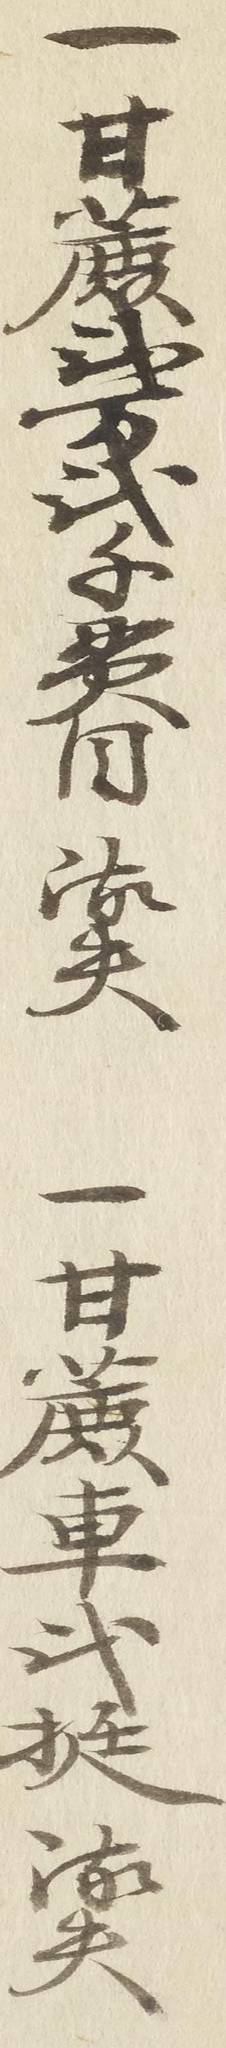一甘蔗弐万弐千貫目流失一甘蔗車弐挺流失
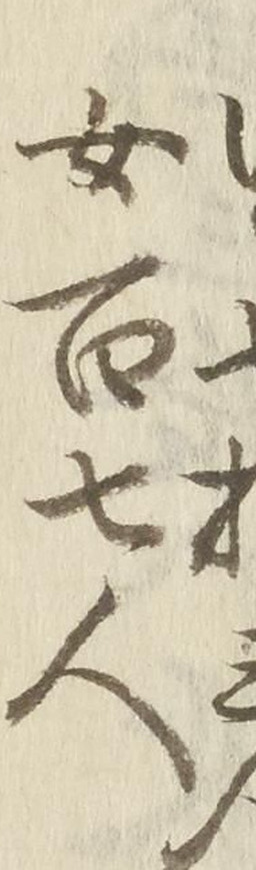女百七人

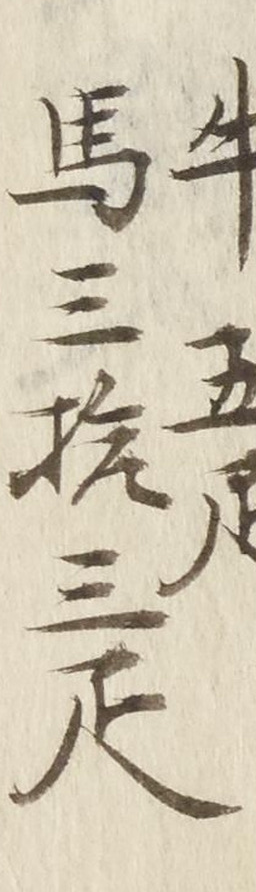馬三拾三疋
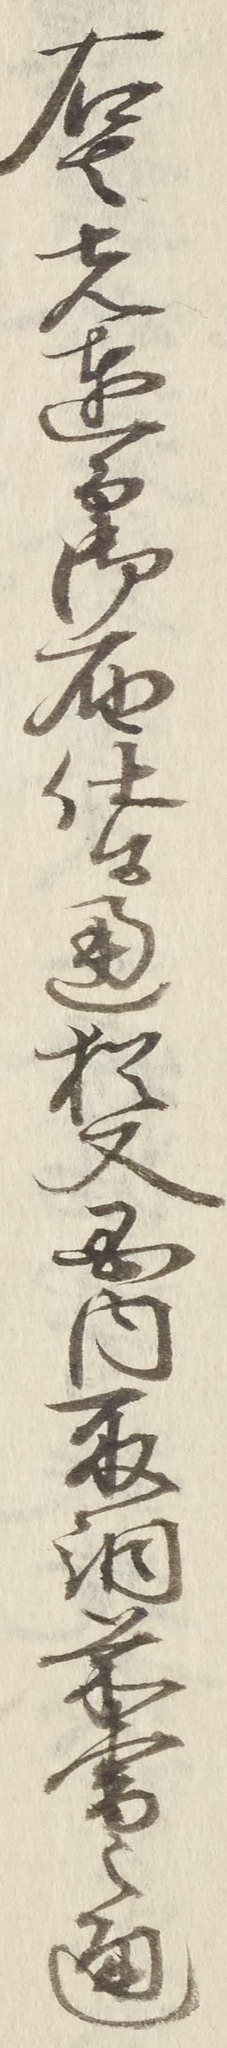右者先達而御届仕候通猶又国内取調前書之通
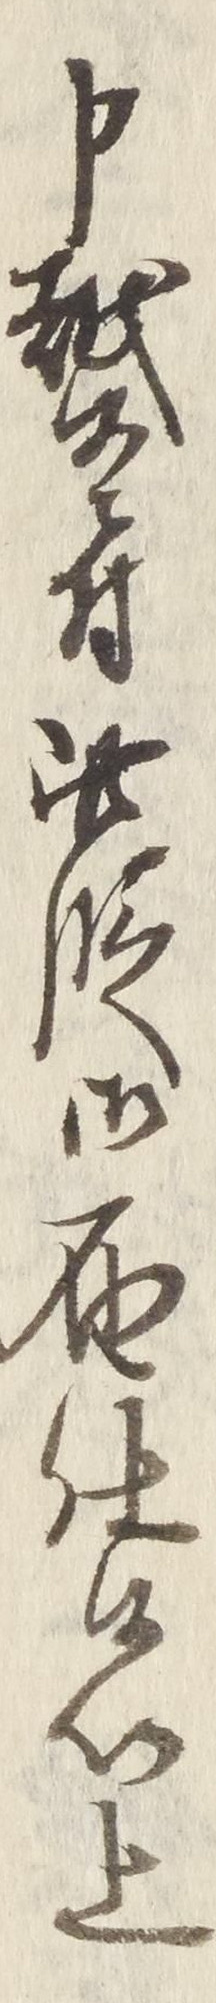申越候ニ付此段御届仕候以上
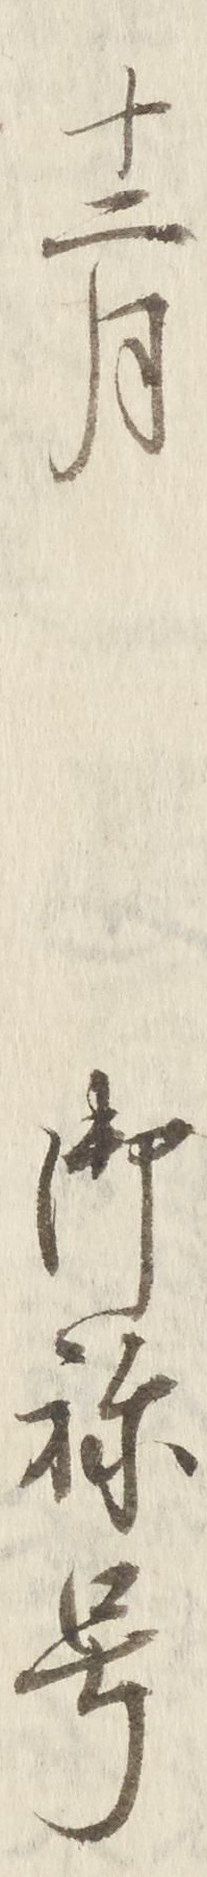十二月御称号
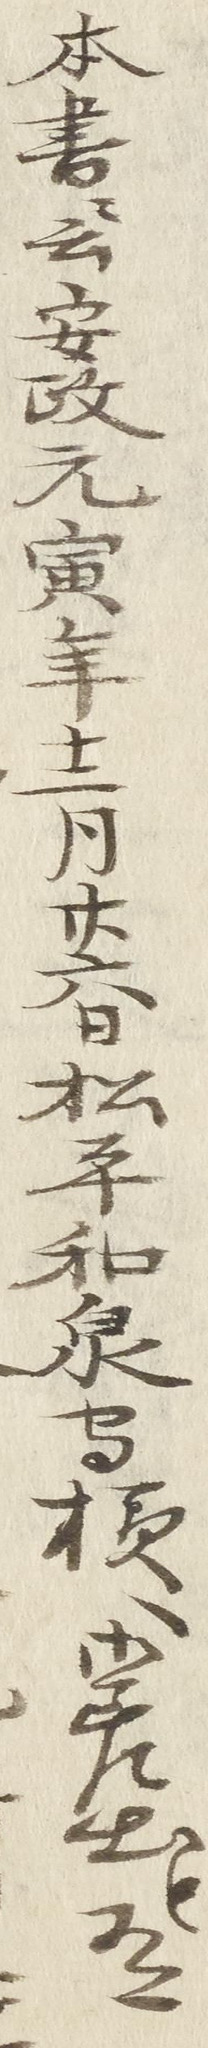本書ニ云安政元寅年十二月廿六日松平和泉守様へ御差出と有
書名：地震記　上
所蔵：東京大学地震研究所図書室 Earthquake Research Institute Library, The University of Tokyo, JAPAN
